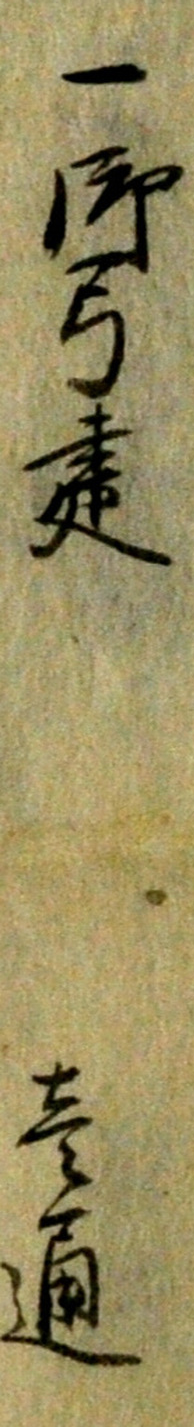一御弓建壱通
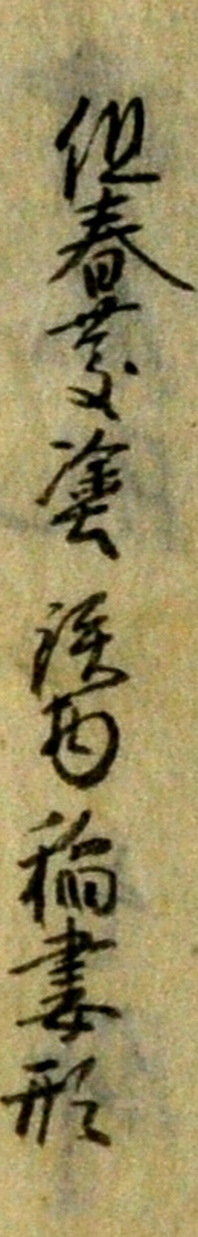但春慶塗鉄物稲妻形
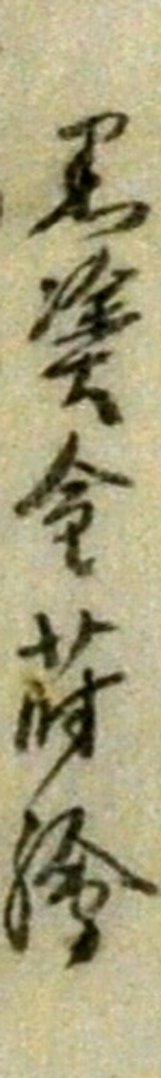黒塗金蒔絵
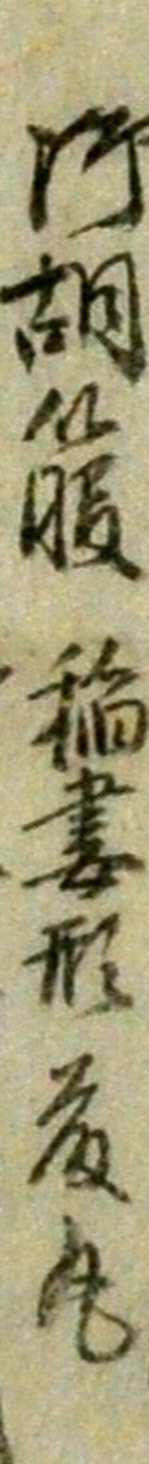御胡箙稲妻形藤丸
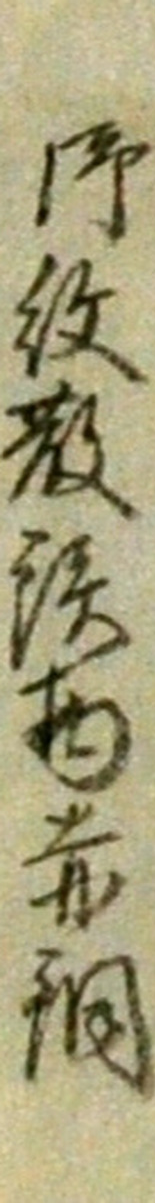御紋散鉄物赤銅
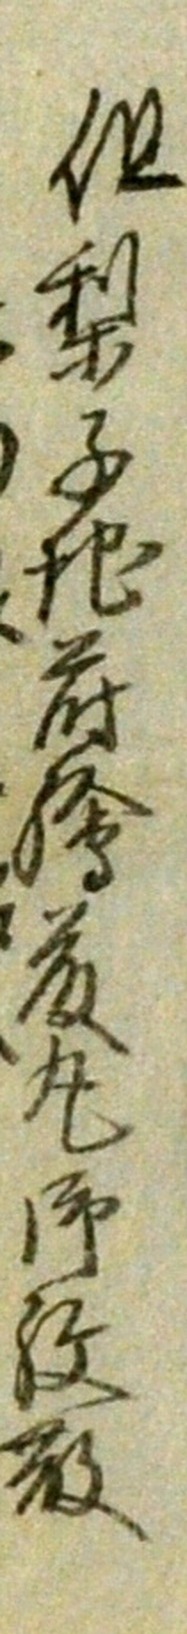但梨子地蒔絵藤丸御紋散
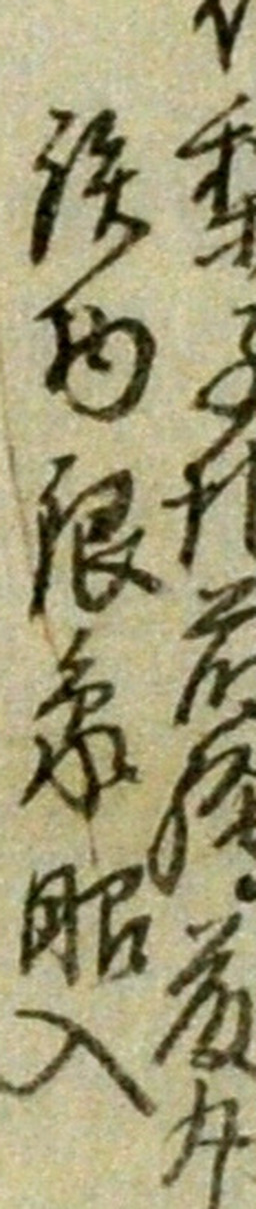鉄物銀象服入
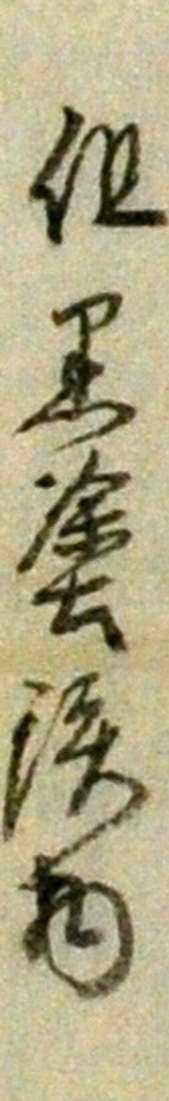但黒塗鉄物
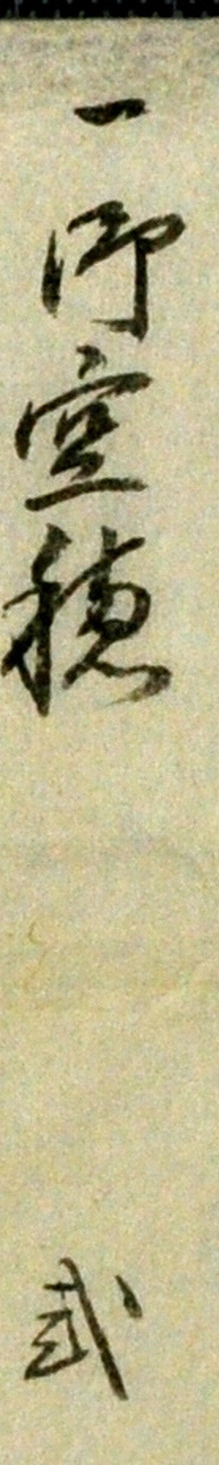一御空穂弐
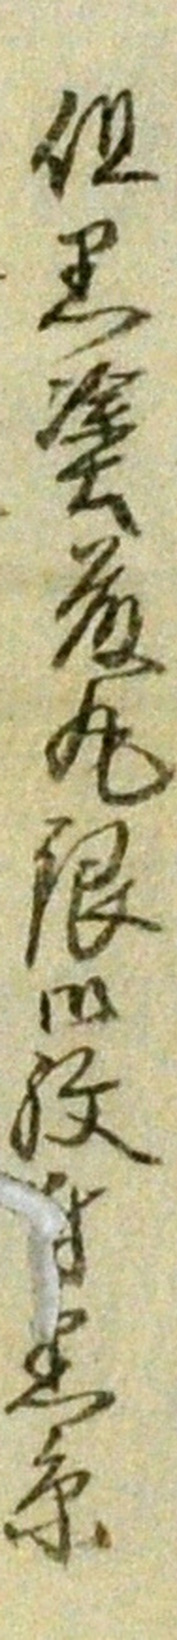但黒塗藤丸銀御紋付黒原
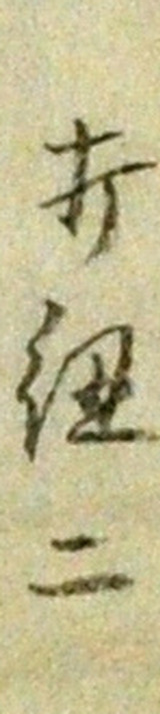打紐二
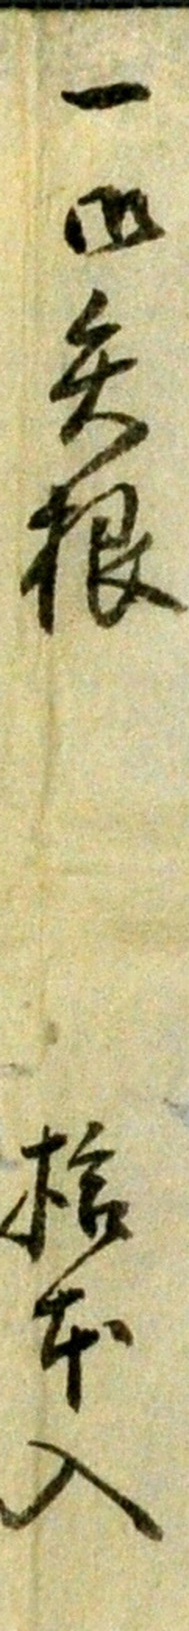一御矢根拾本入
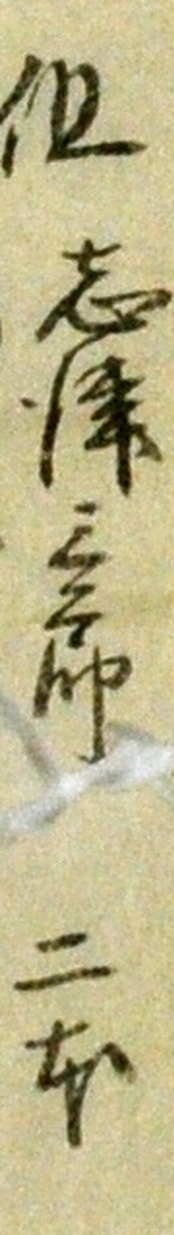但志津三郎二本
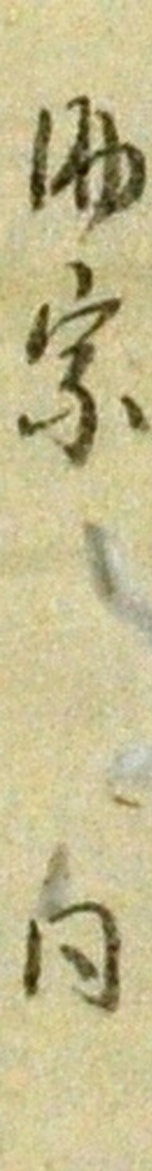助宗同
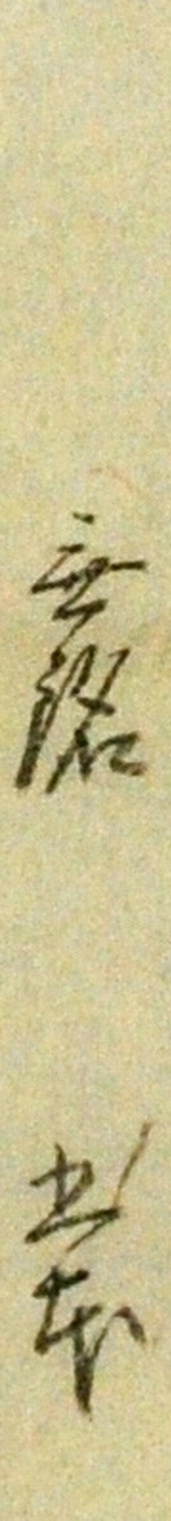無銘五本
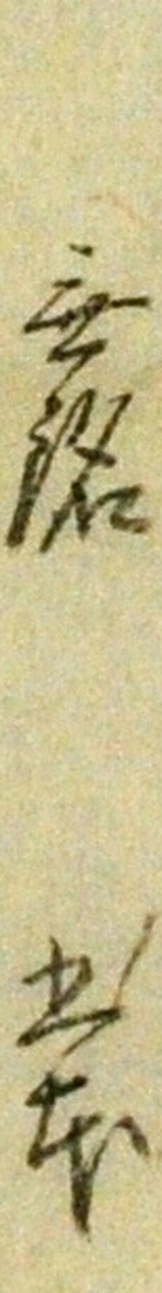無銘五本
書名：目録
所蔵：伊那市立高遠町図書館・合同会社AMANE
